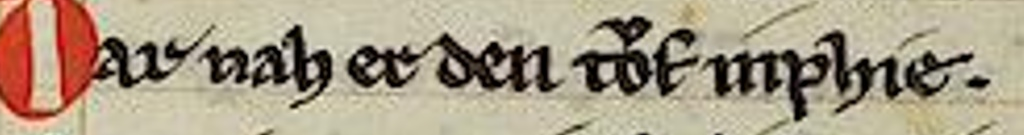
*Dar nah er den to°vf inphie.
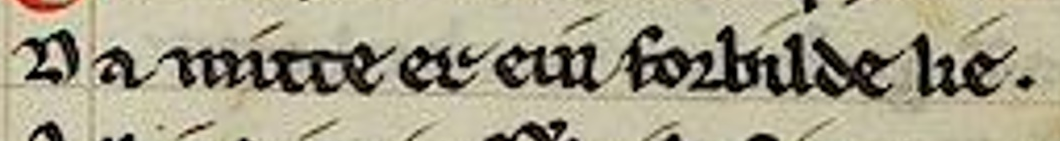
Da mitte er ein forbilde lie.
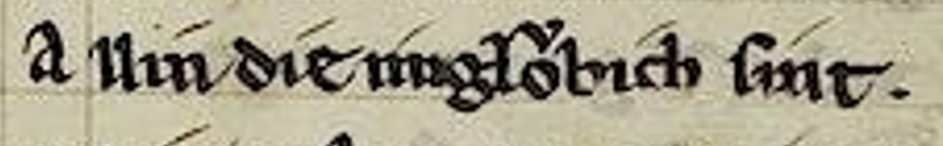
Allin die imglo°vbich ſint.
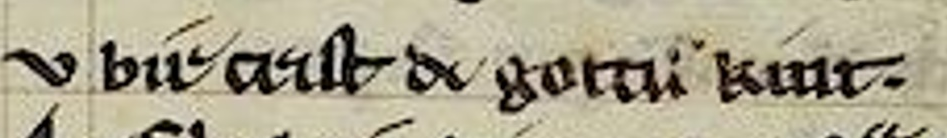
Vbir criſt d(az) gottiſ kint.
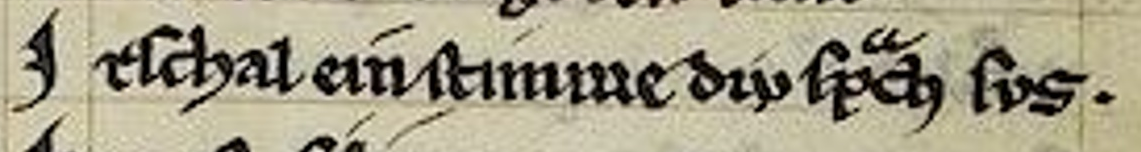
Irſchal ein ſtimme div ſp(ra)ch ſvs.
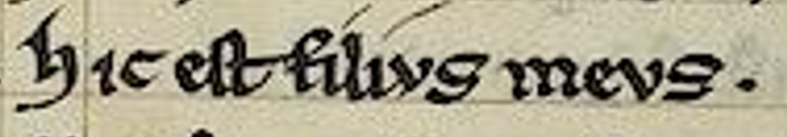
Hic eſt filivs mevs.
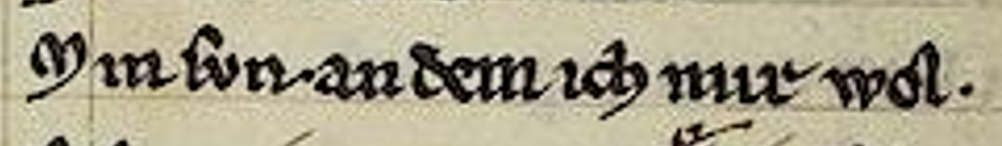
Min ſvn. an dem ich mir wol.
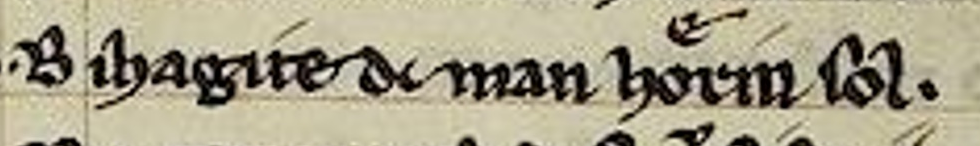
Bihagite d(az) man ho°erin ſol.
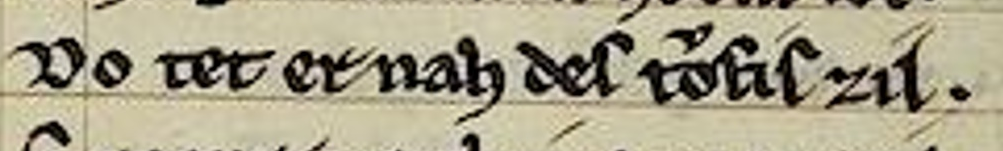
Do tet er nah deſ to°vfiſ zil.
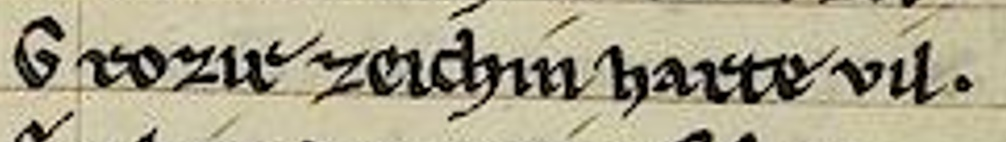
Grozir zeichin harte vil.
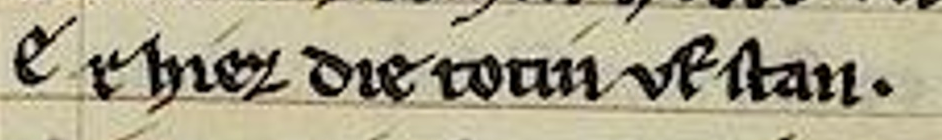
Er hiez die totin vf ſtan.
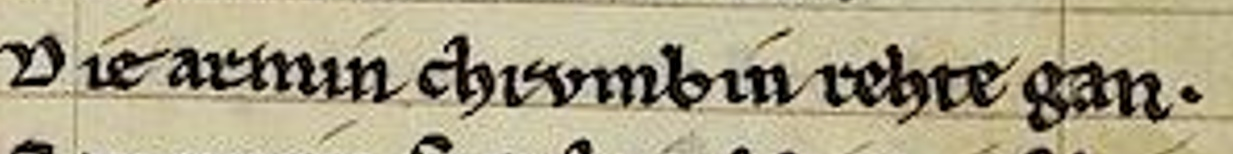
Die armin chrvmbin rehte gan.
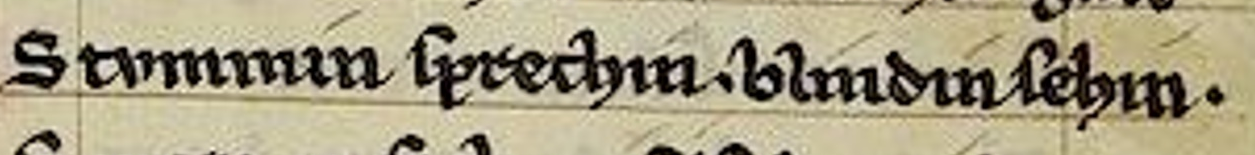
Stvmmin ſprechin. blindin ſehin.
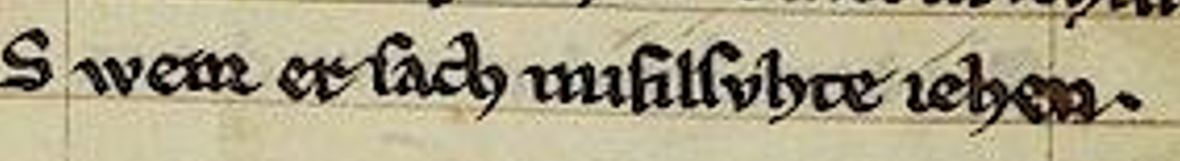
Swem er ſach miſilſvhte iehen.
